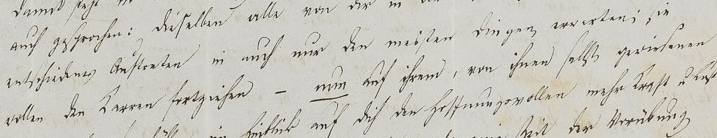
wollen den Karren fortziehen – nun auf ihrem, von ihnen selbst gewiesenen
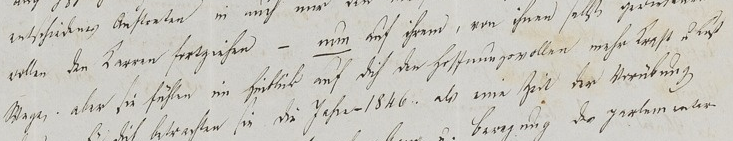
Wege, aber sie fühlen im Hinblick auf dich den Hoffnungsvollen mehr Kraft u.
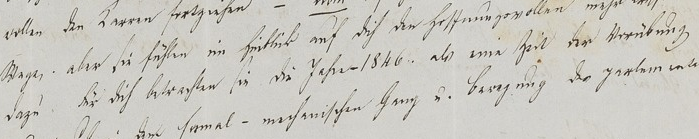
dazu. Für dich betrachten sie die Jahre – 1846 als eine Zeit der Vorübung,
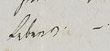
Lebens. –
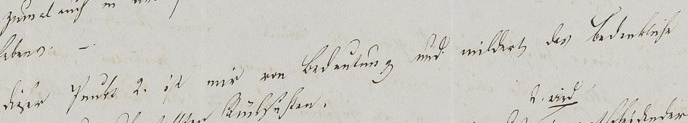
Dieser Punkt 2: ist mir von Bedeutung und mildert das Bedenkliche
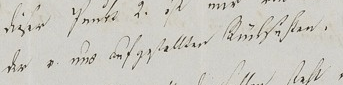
der v. uns aufgestellten Rücksichten.
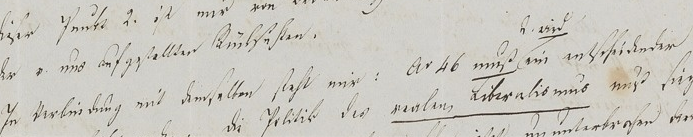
In Verbindung mit demselben steht mir: Ao 46 mußu. wird ein entscheidender
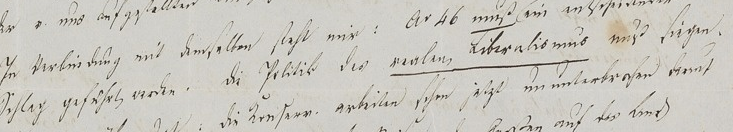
Schlag geführt werden. Die Politik des realen Liberalismus muß siegen.
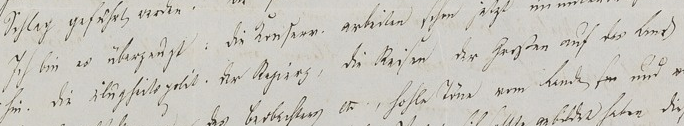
hin. Die Klugheitspolit. der Regierg, die Reisen der Großen auf das Land,
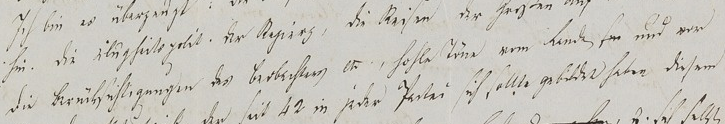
die Berücksichtigungen des Beobachters etc., hohle Töne vom Lande her und vor
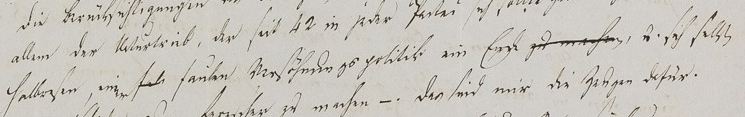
Halbwesen, einer faulen Versöhnungspolitik ein Ende zu machen, u. sich selbst
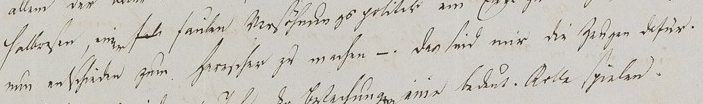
nun entschieden zum Herrscher zu machen – Das sind mir die Zeugen dafür.
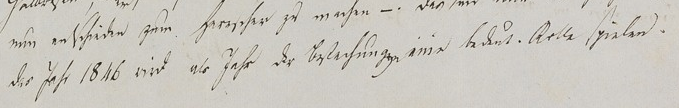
Das Jahr 1846 wird als Jahr der Bestechungen eine bedeut. Rolle spielen
